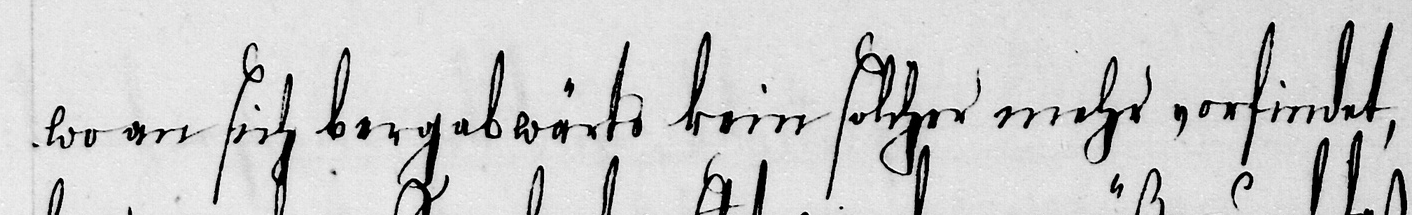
wo an sich bergabwärts kein solcher mehr vorfindet,
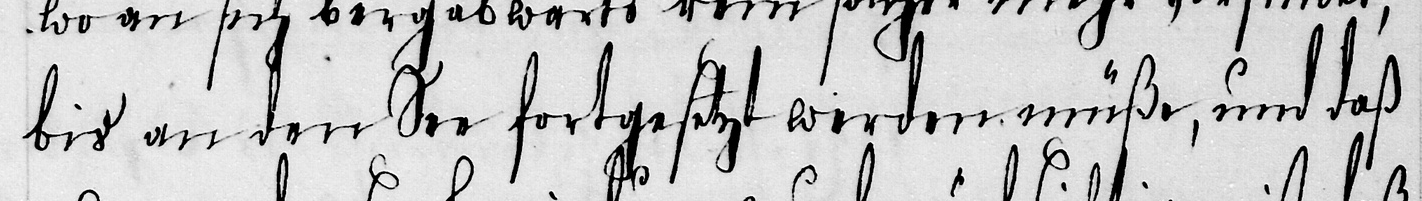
bis an den See fortgesetzt werden müße, und daß
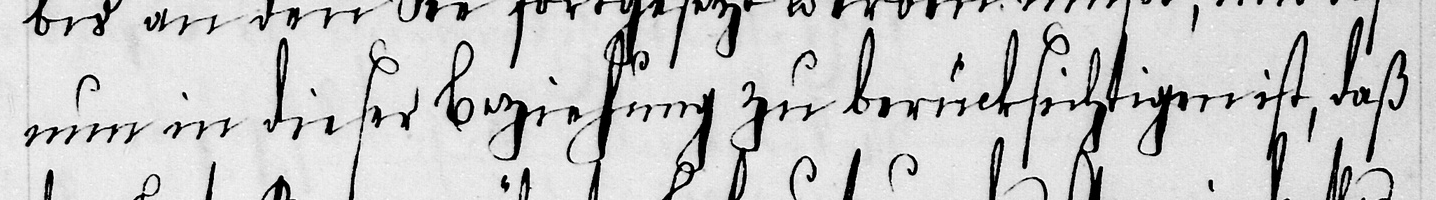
nun in dieser Beziehung zu berücksichtigen ist ,daß
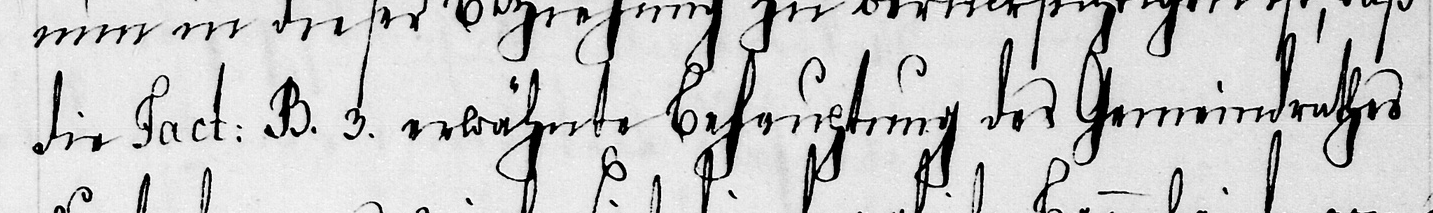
die Fact: B. 3. erwähnte Behauptung des Gemeindrathes
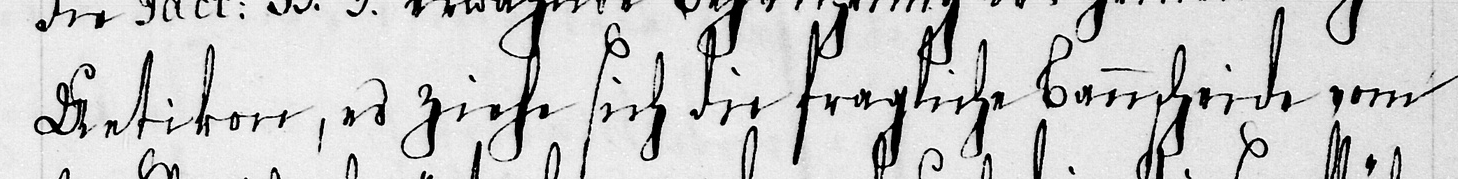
Uetikon, es ziehe sich die fragliche Bannscheide vom
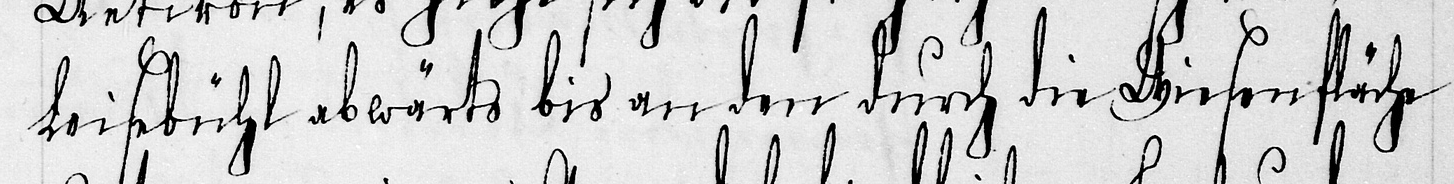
Leisebühl abwärts bis an den durch die Wiesenfläche
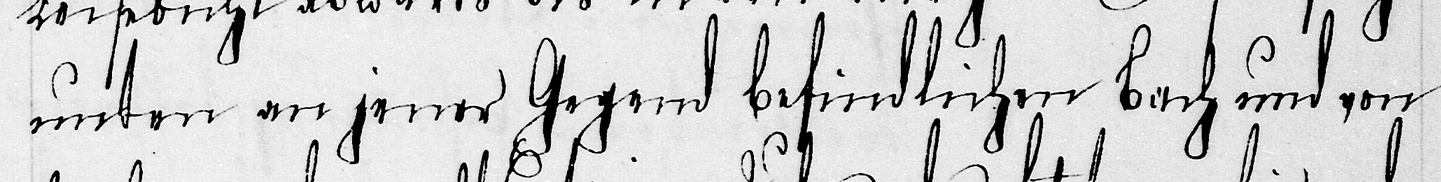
unten an jener Gegend befindlichen Bach und von
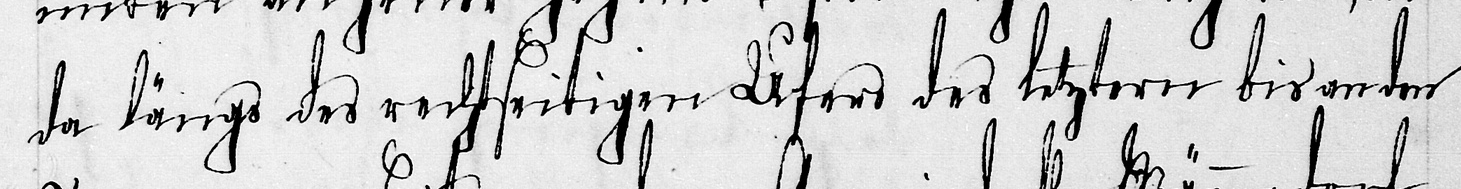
da längs des rechtseitigen Ufers des letztern bis an den
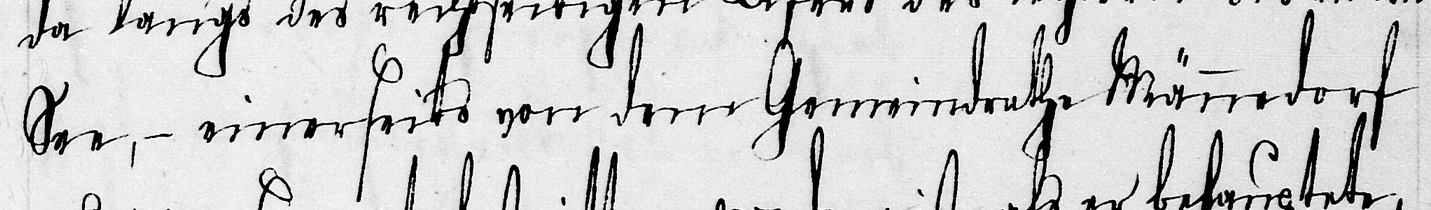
See, – einerseits von dem Gemeindrathe Männedorf
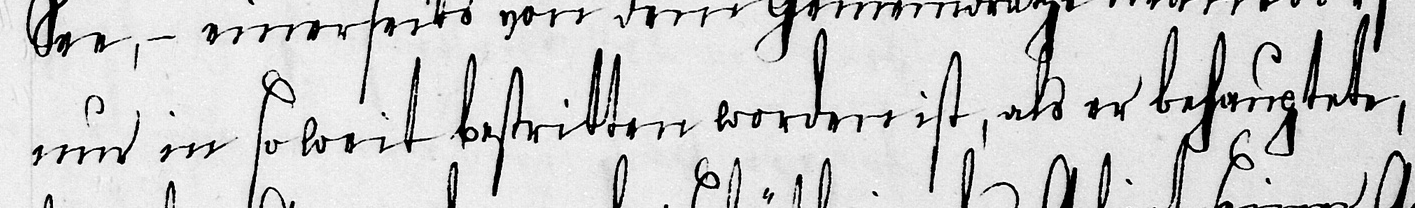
und in so weit bestritten worden ist, als er behauptete,
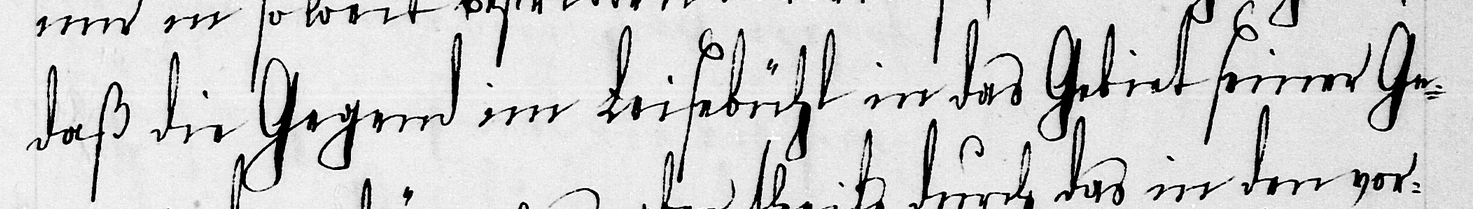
daß die Gegend im Leisebühl in das Gebiet seiner Ge¬
